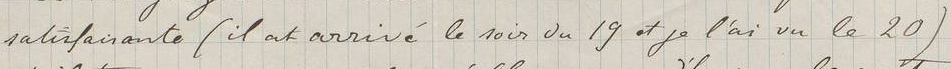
satisfaisante (il est arrivé le soir du 19 et je l'ai vu le 20)
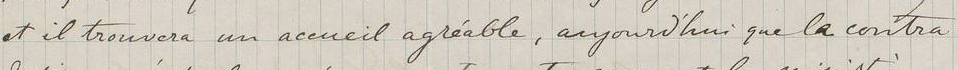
et il trouvera un accueil agréable, aujourd'hui que la contra-
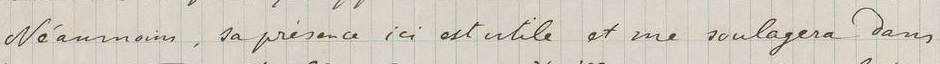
Néanmoins, sa présence ici est utile et me soulagera dans
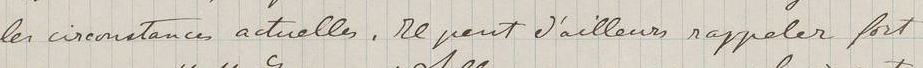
les circonstances actuelles. Il peut d'ailleurs rappeler fort
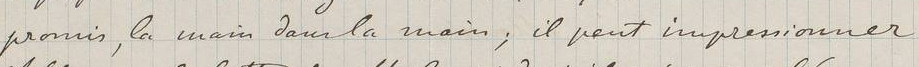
promis, la main dans la main; il peut impressionner
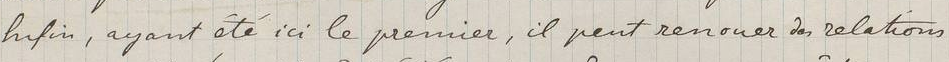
Enfin, ayant été ici le premier, il peut renoncer des relations
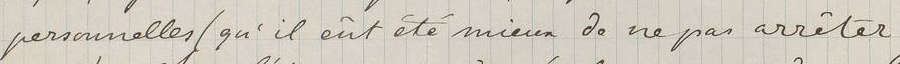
personnelles (qu'il eût été mieux de ne pas arrêter
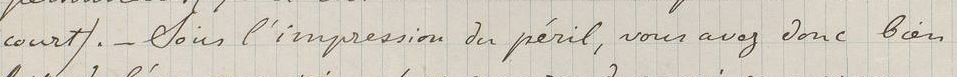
court). – Sous l'impression du péril, vous avez donc bien
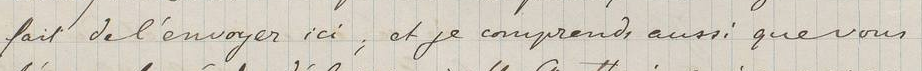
fait de l'envoyer ici; et je comprends aussi que vous
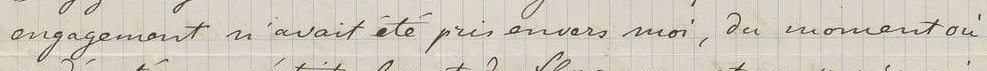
engagement n'avait été pris envers moi, du moment où
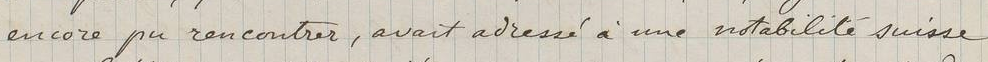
encore pu rencontrer, avait adressé à une notabilité suisse
